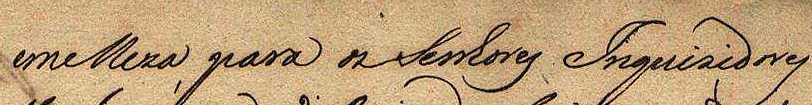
em Meza, para os Senhores Inquizidores
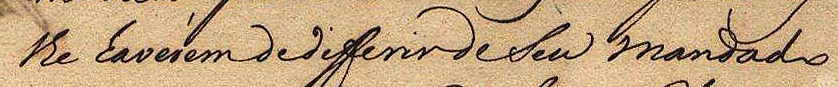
lhe haverem de differir de Seu mandado
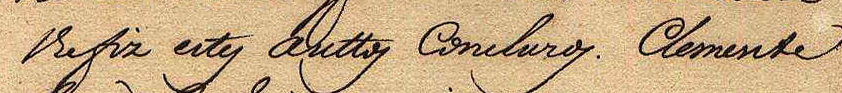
lhe fiz estes auttos Concluzos. Clemente
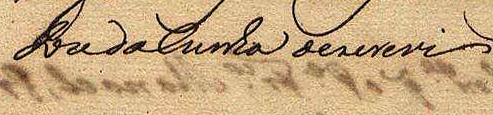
Ioze da Cunha o escrevi
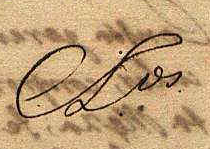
CL.os
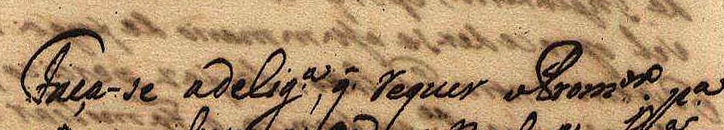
Faça-se a delig.a, q̄ requer o Prom.or p.a
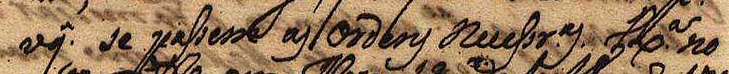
o q̄. se passem as ordens necessr.as. Lxa no
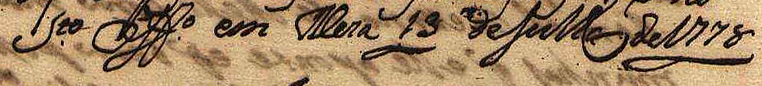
S.to Off.o em Meza 13 de Julho de 1778
